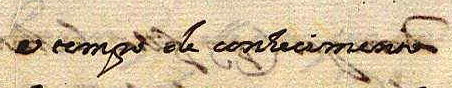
e tempo de conhecimento
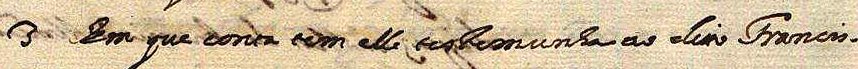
3 Em que conta tem elle testemunha ao ditto Francis
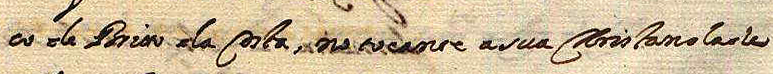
co de Britto da Costa, no tocante a sua Christandade
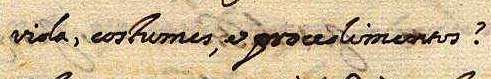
vida, costumes, e procedimentos?
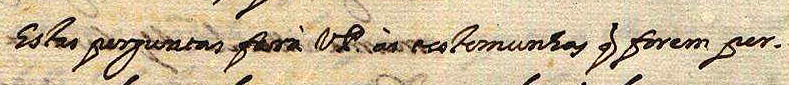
Estas perguntas fará VP. às testemunhas q̄ forem per
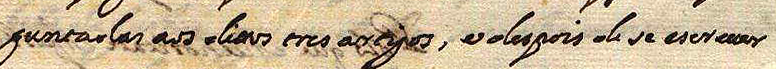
guntadas aos dittos tres artigos, e despois de se escreuer
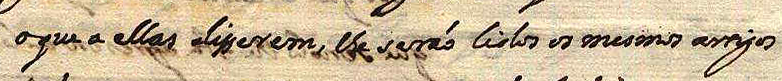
o que a ellas disserem, lhe seraõ lidos os mesmos artigos
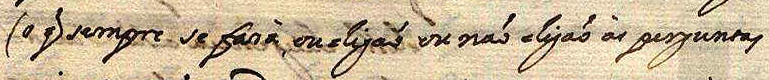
(o q̄ sempre se farà, ou digaõ ou naõ digaõ às perguntas
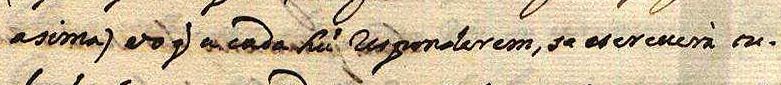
asima) e o q̄ a cada hū responderem, se escreuerà tu
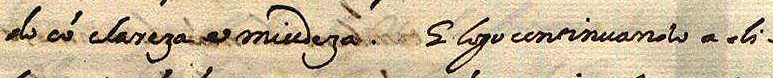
do cō clareza e miudeza. E logo continuando a di
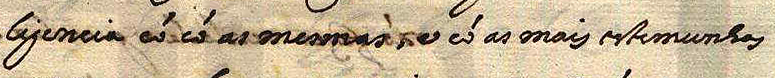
ligencia cō cō as mesmas, e cō as mais testemunhas
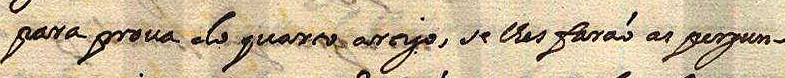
para proua do quarto artigo, se lhes faraõ as pergun
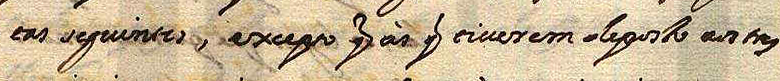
tas seguintes, excepto q̄ às q̄ tiuerem deposto aos tres
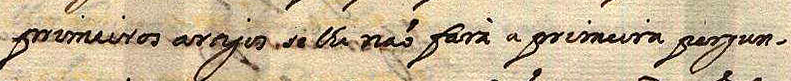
primeiros artigos se lhe naõ farà a primeira pergun
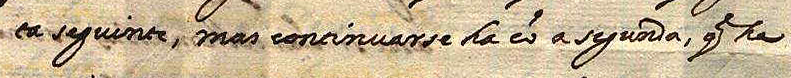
ta seguinte, mas continuarse ha cō a segunda, q̄ he
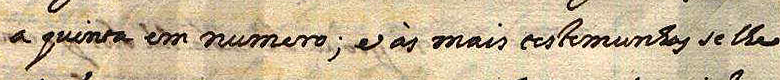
a quinta em numero; e às mais testemunhas se lhe
